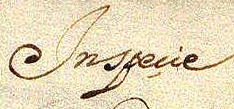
In specie
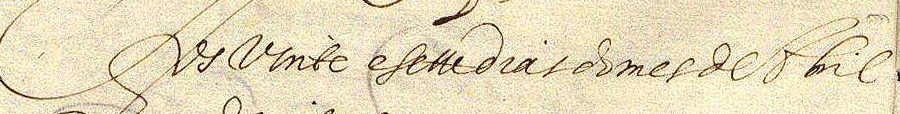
Aos vinte e sette dias do mes de Abril
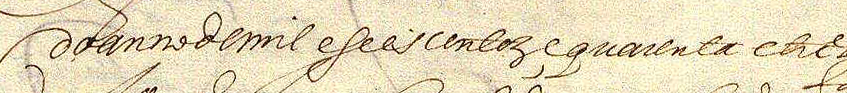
do anno de mil e seiscentos e quarenta e tres
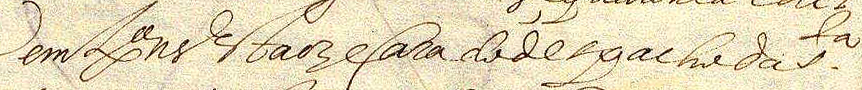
em Lxa nos Estaoz e Caza do despacho da s.ta
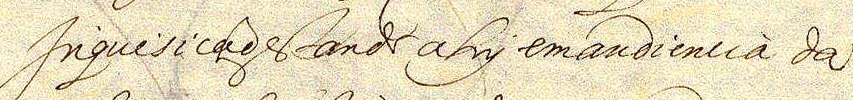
Jnquisiçaõ estando ahy em audiencia da
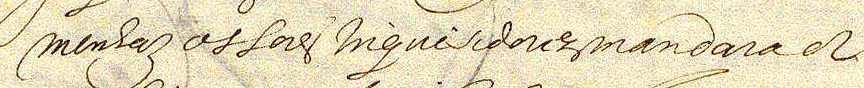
menhã os sores Inquisidores mandaraõ
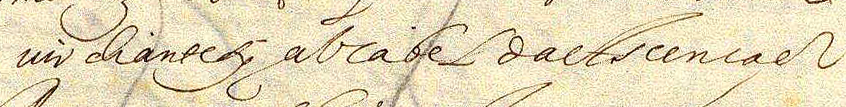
uir diante sy a Izabel da Ascençaõ
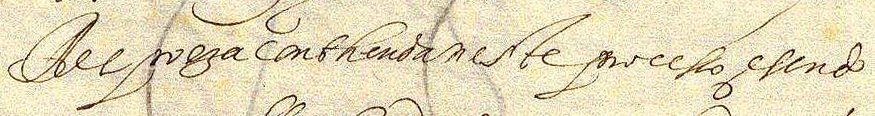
Ree preza contheuda neste processo e sendo
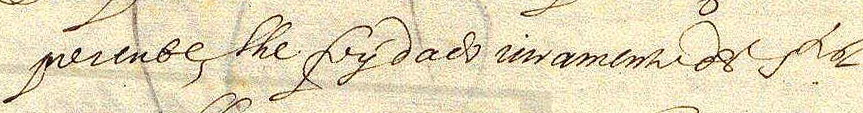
prezente, lhe foy dado iuramento dos stos
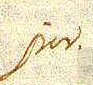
jur.
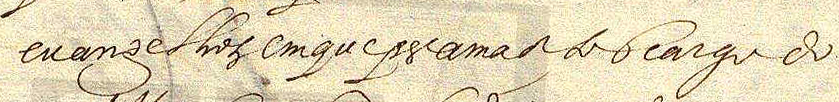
euangelhos em que pos a maõ sob cargo do
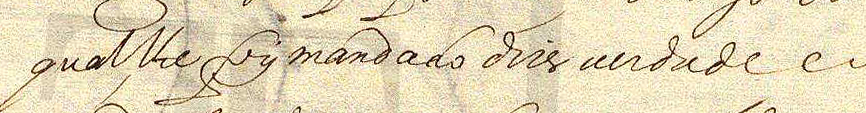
qual lhe foy mandado dizer uerdade e
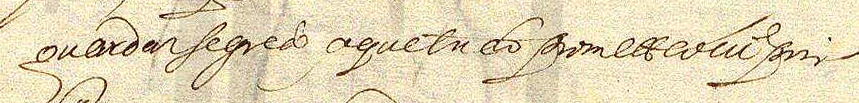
guardar segredo o que tudo prometteo cūprir
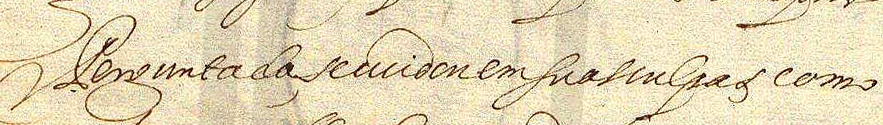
Perguntada se cuidou em suas culpas como
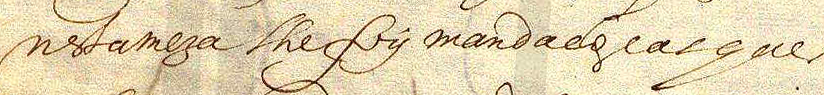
nesta meza lhe foy mandado e as quer
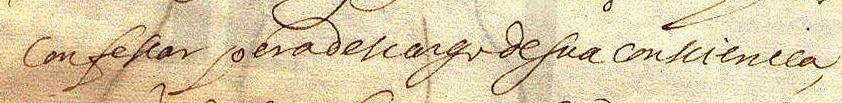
confessar pera descargo de sua consciencia,
